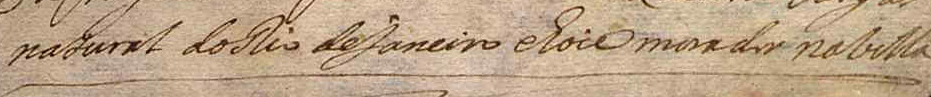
natural do Rio de Janeiro e hoie morador na villa
